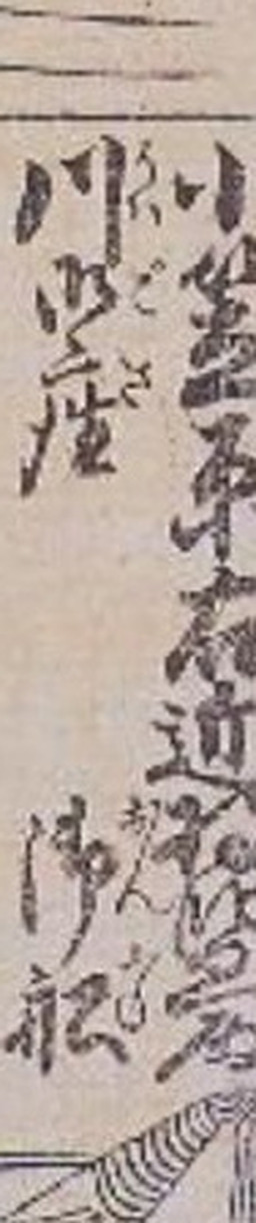川御座御船

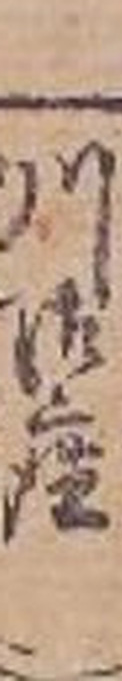川御座
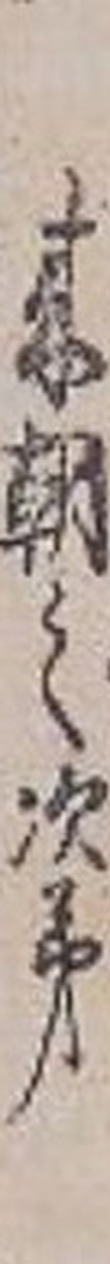来朝之次第
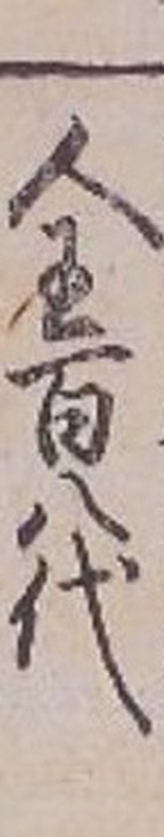人王百八代
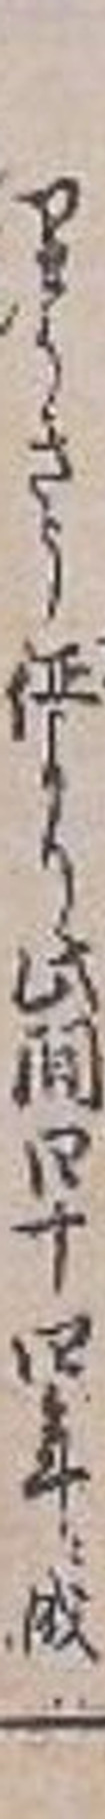りうきう征より此間四十四年に成
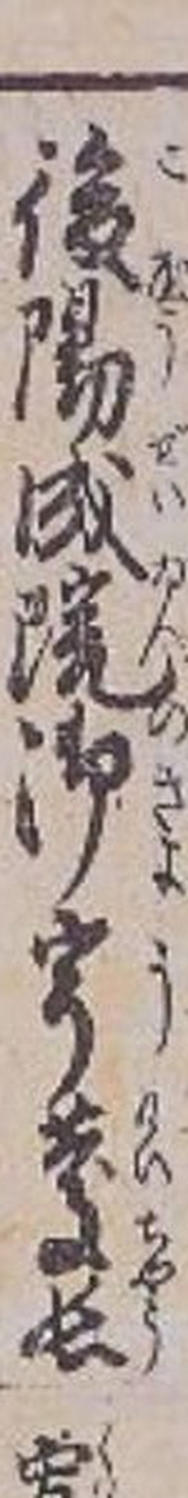後陽成院御宇慶長
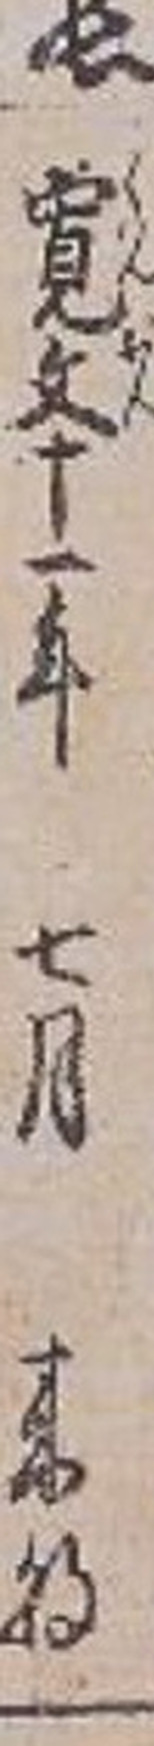寛文十一年七月来朝
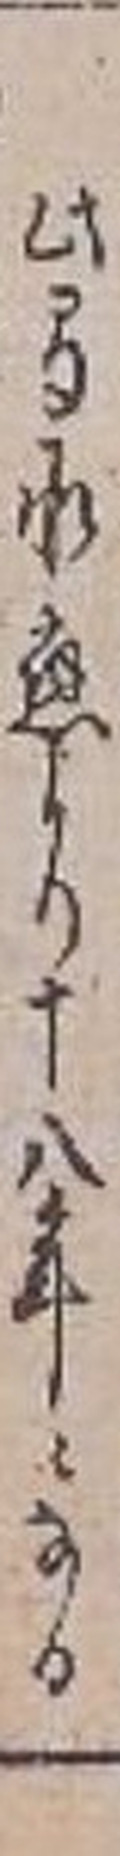此間承應より十八年になる
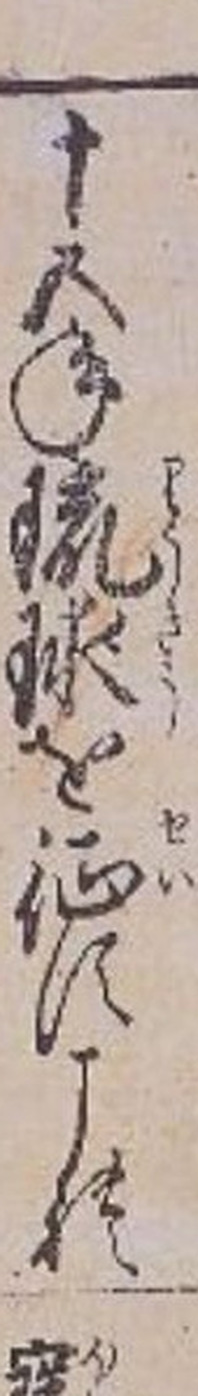十五年琉球を征すこれ
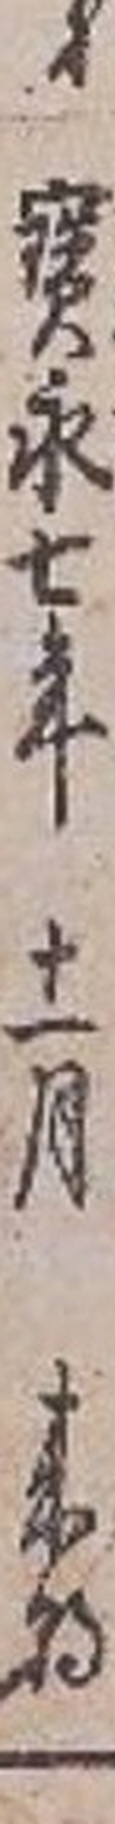寶永七年十一月来朝
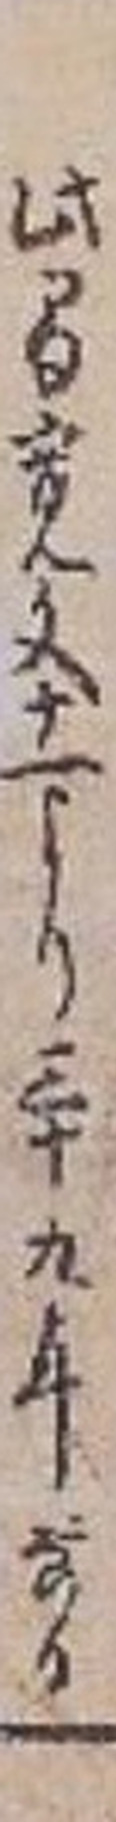此間寛文十一より三十九年になる
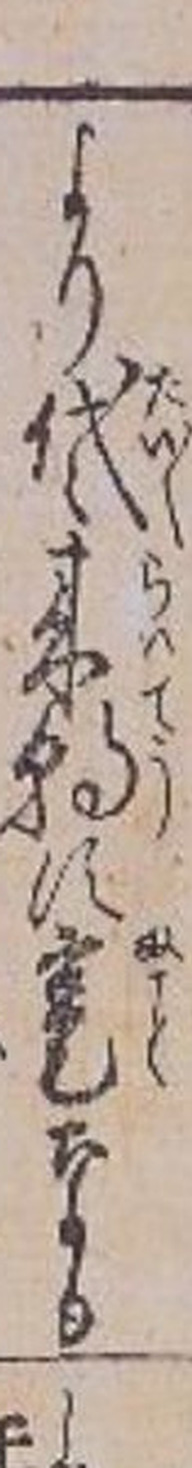より代々来朝す實なる
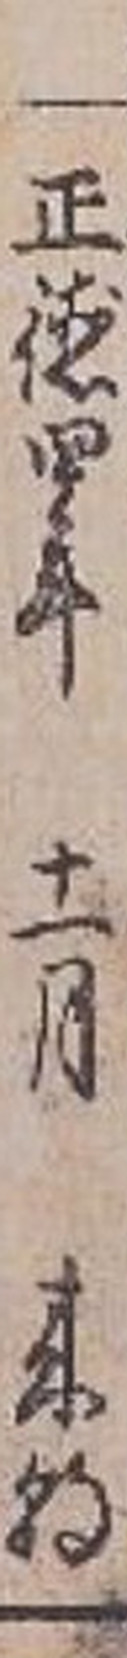正徳四年十一月来朝
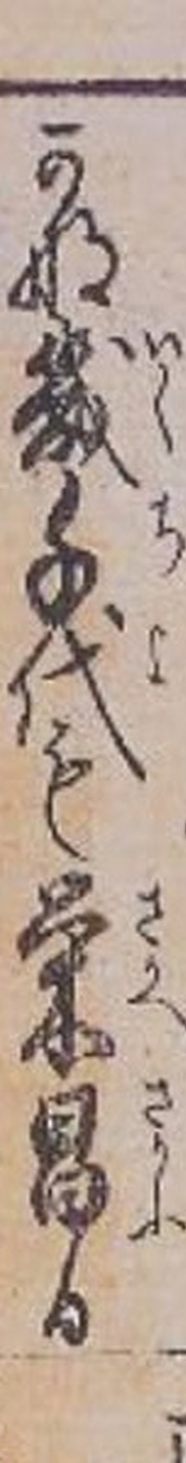かな幾千代を栄昌る
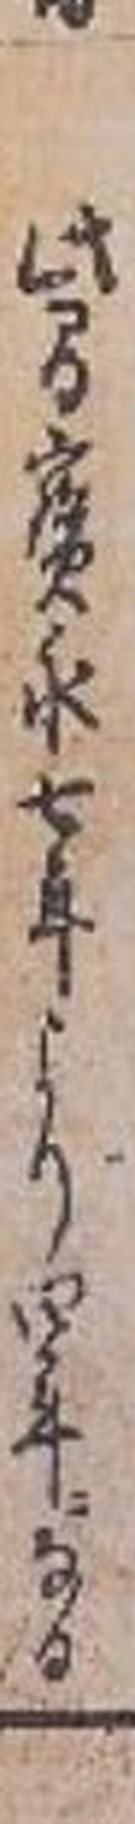此間寶永七年より四年になる
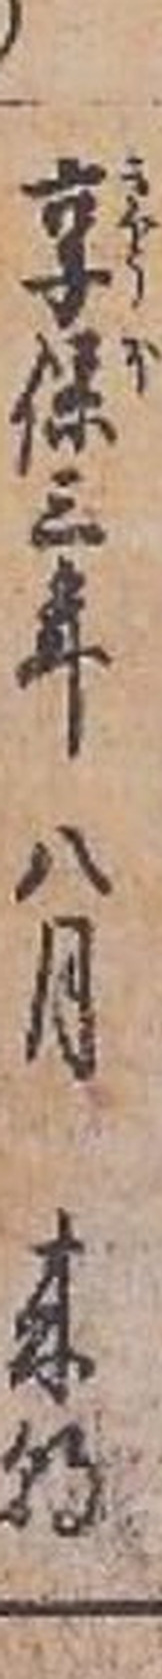享保三年八月来朝
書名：琉球人大行列記 大全 来朝新板絵入
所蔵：University of the Ryukyus Library
